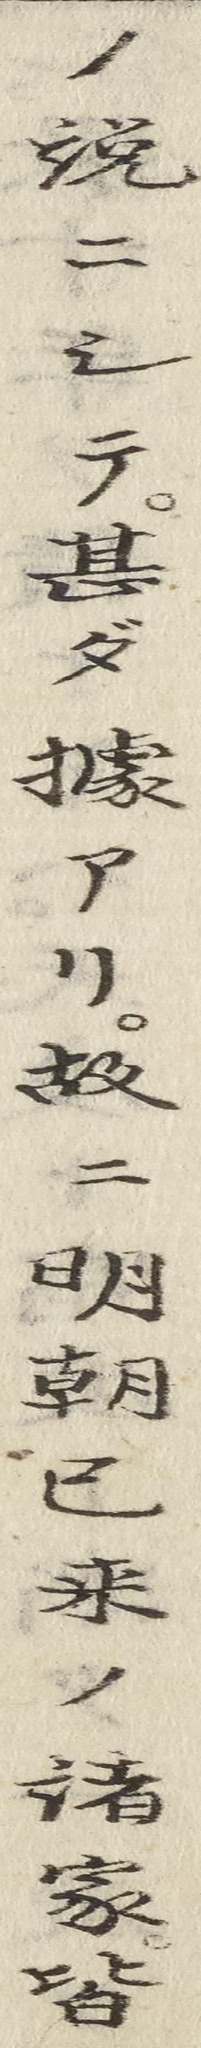ノ説ニシテ。甚ダ拠アリ。故ニ明朝已来ノ諸家。皆
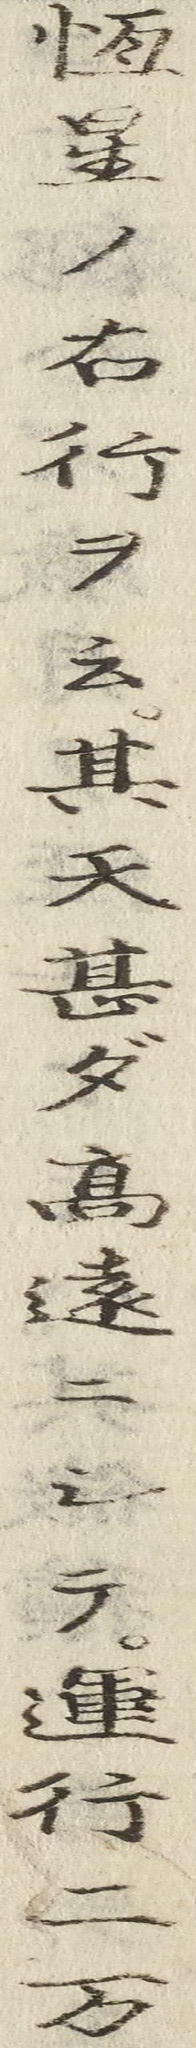恒星ノ右行ヲ云。其天甚ダ高遠ニシテ。運行二万
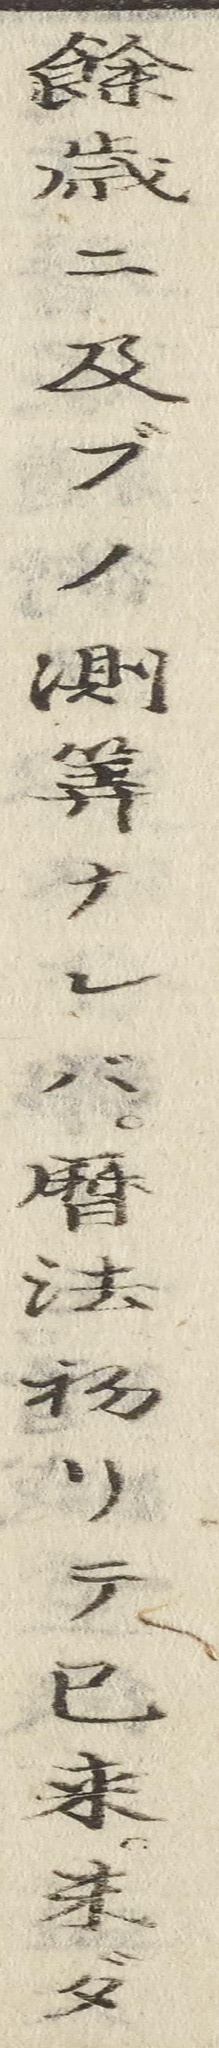余歳ニ及ブノ測算ナレバ。暦法初リテ已来。未ダ
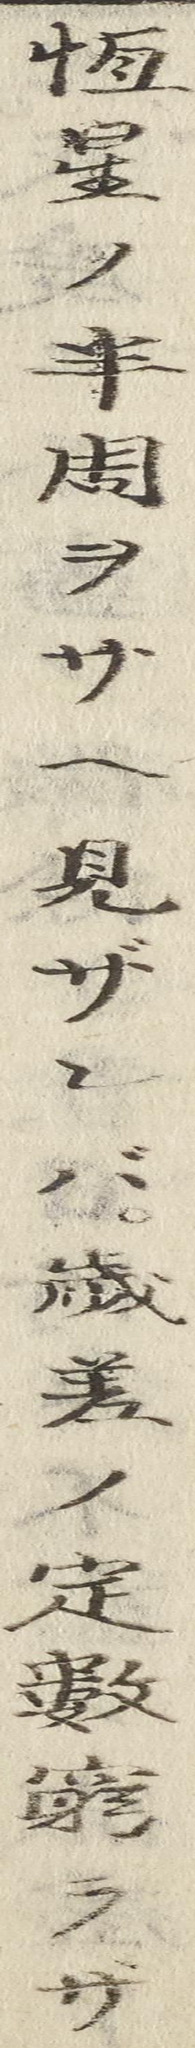恒星ノ半周ヲサヘ見ザレバ。歳差ノ定数窮ラザ
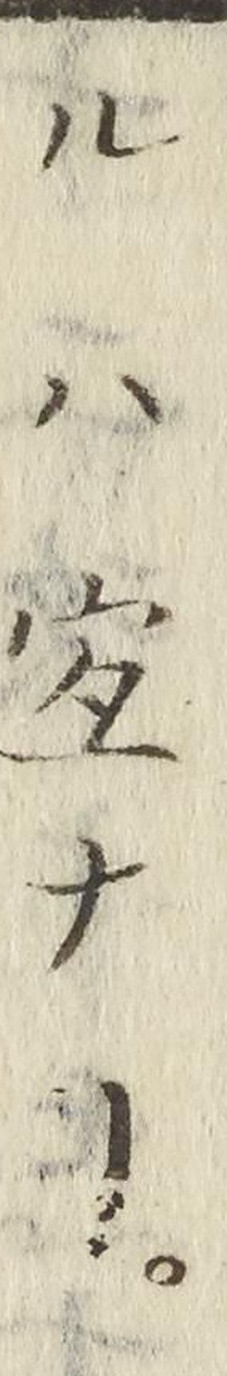ルハ宜ナリ。
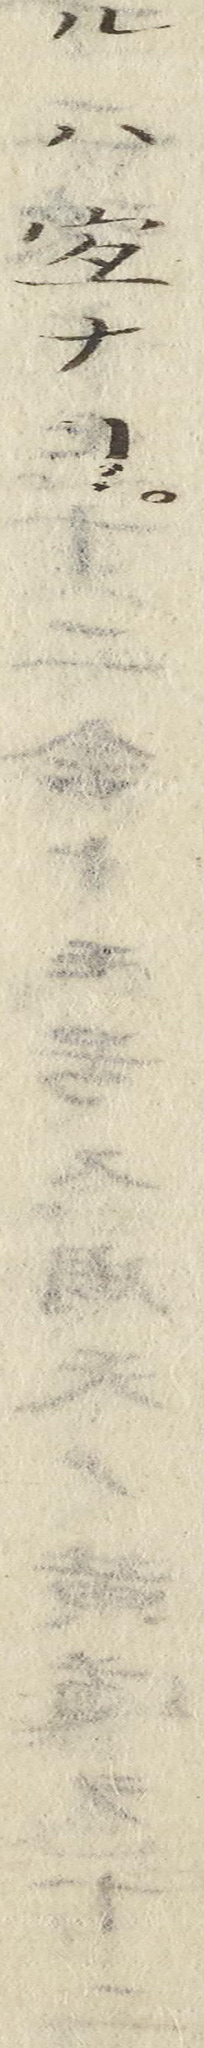ルハ宜ナリ。
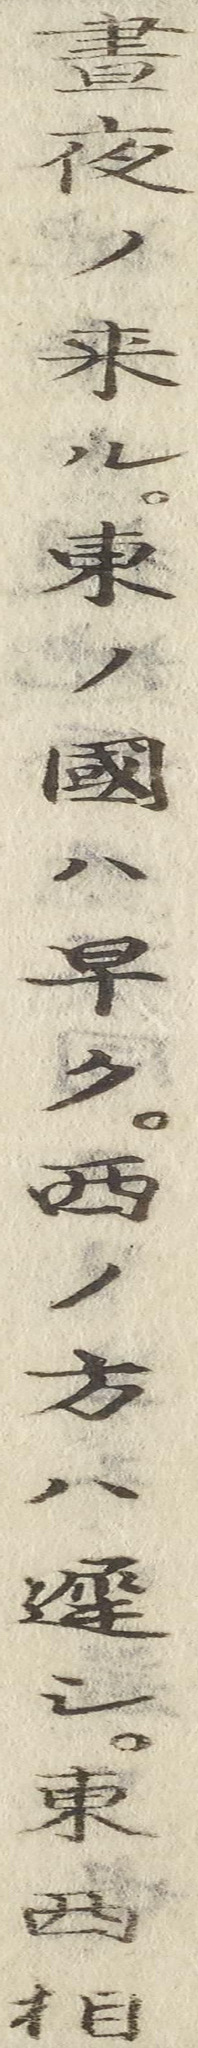昼夜ノ来ル。東ノ国ハ早ク。西ノ方ハ遅シ。東西相
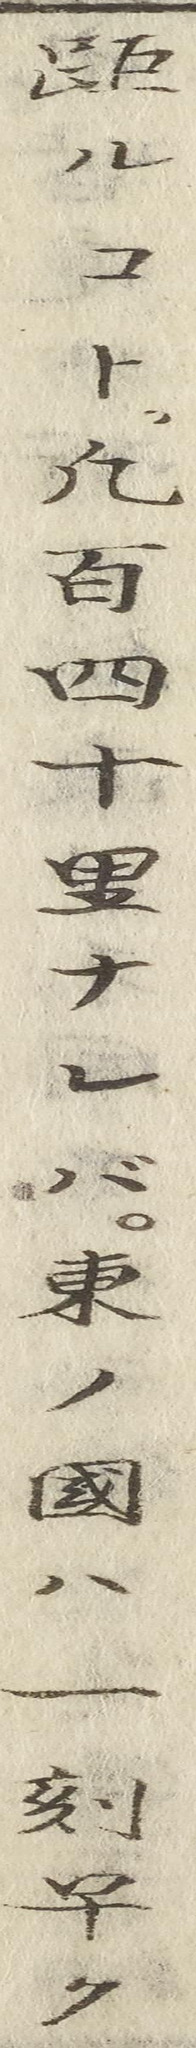距ルコト。凡百四十里ナレバ。東ノ国ハ一刻早ク
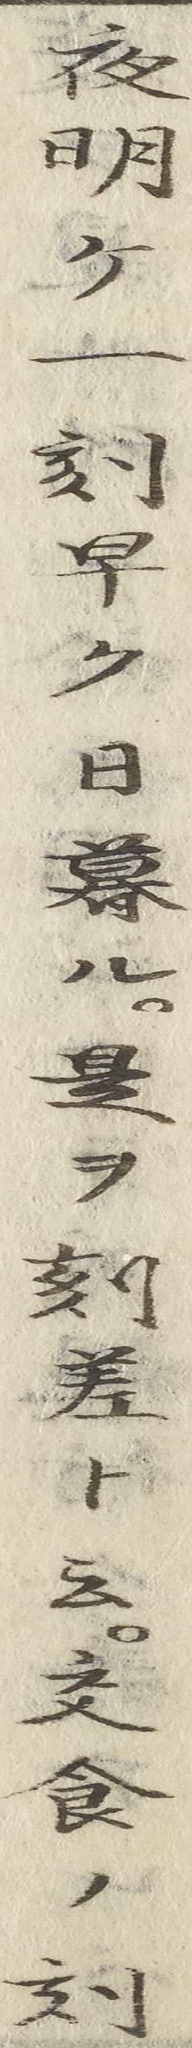夜明ケ一刻早ク日暮ル。是ヲ刻差ト云。交食ノ刻
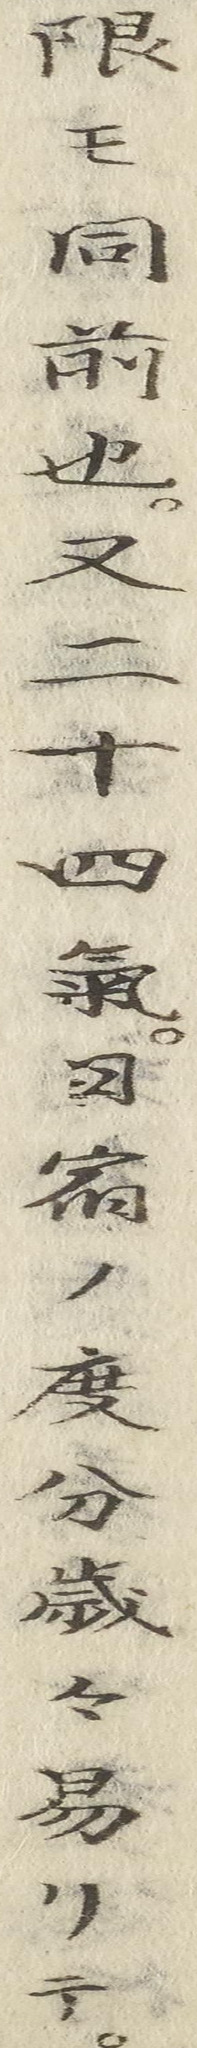限モ同前也。又二十四気。日宿ノ度分歳々易リテ。
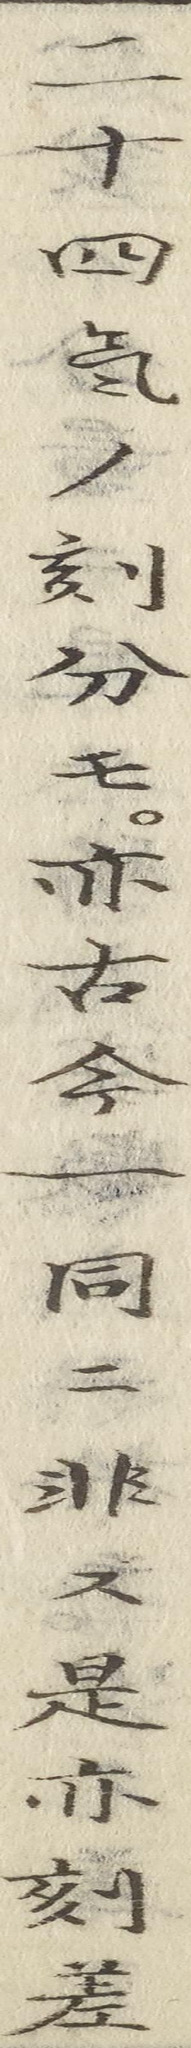二十四気ノ刻分モ。亦古今一同ニ非ス是亦刻差
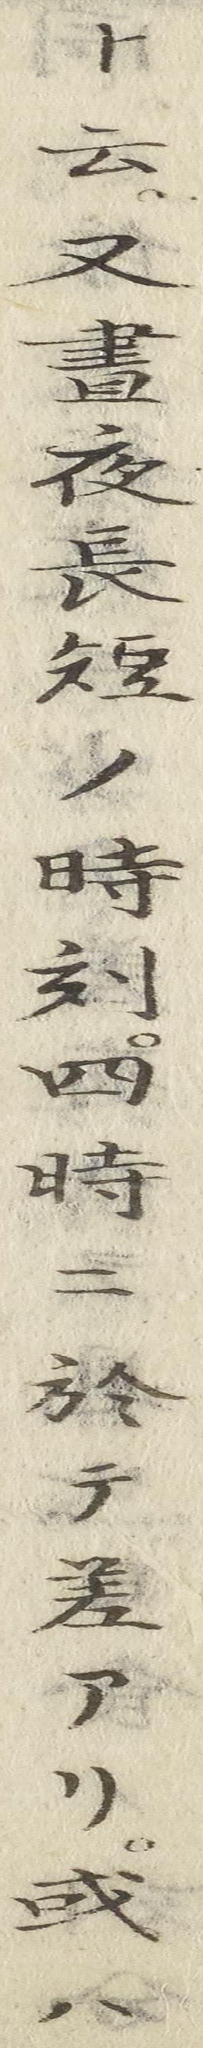ト云。又昼夜長短ノ時刻。四時ニ於テ差アリ。或ハ
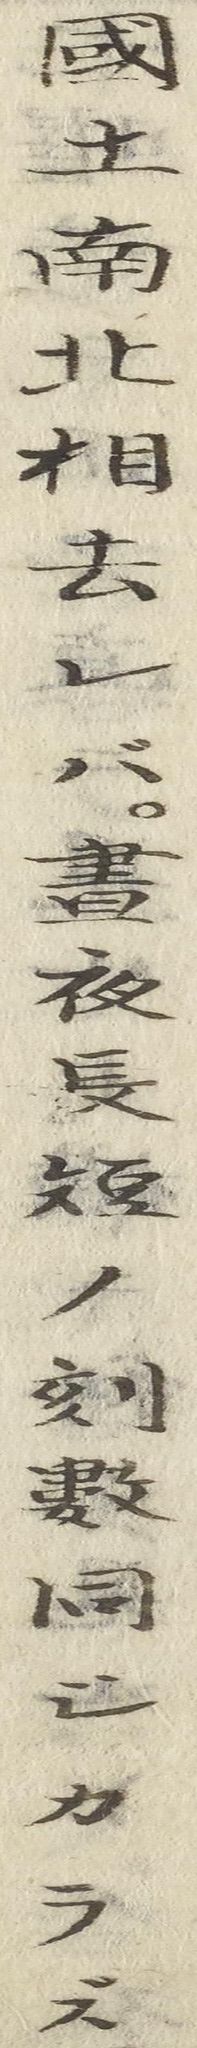国土南北相去レバ。昼夜長短ノ刻数同ジカラズ。
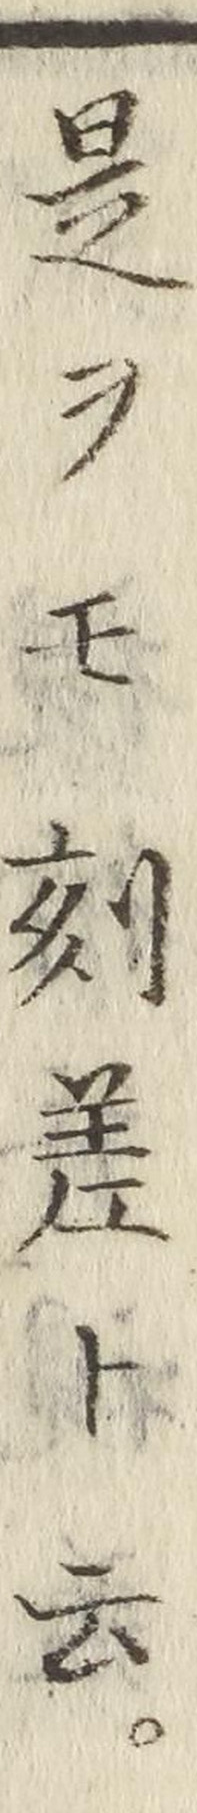是ヲモ刻差ト云。

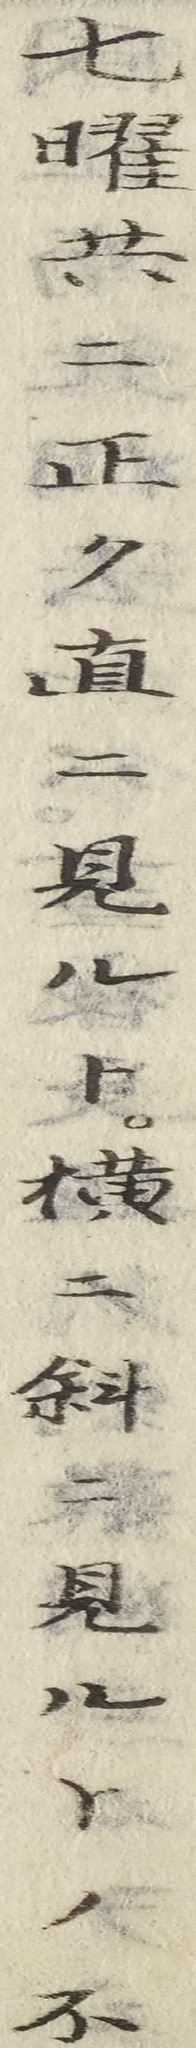七曜共ニ正ク直ニ見ルト。横ニ斜ニ見ルトノ不
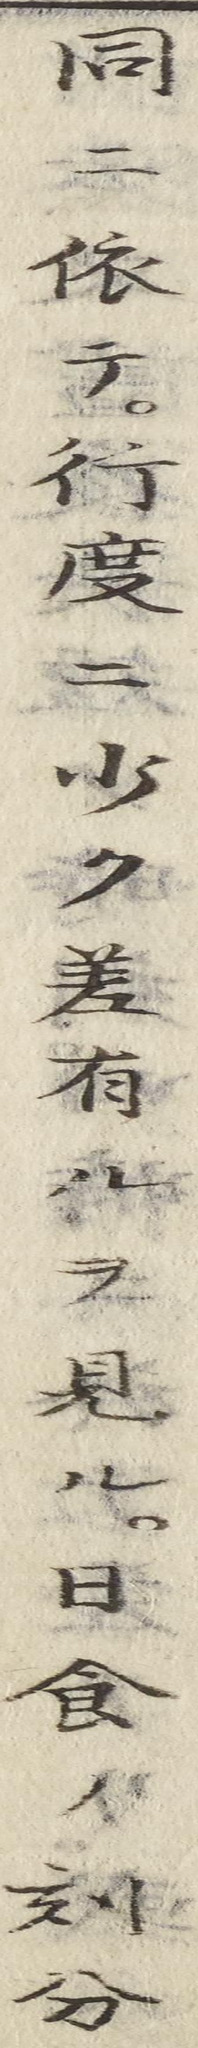同ニ依テ。行度ニ。少ク差有ルヲ見ル。日食ノ刻分
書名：大略天学名目鈔　天經或問附録
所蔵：東京大学地震研究所図書室 Earthquake Research Institute Library, The University of Tokyo, JAPAN
